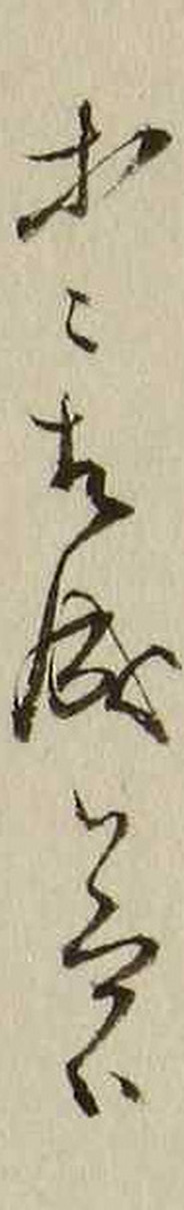等に相成候而は
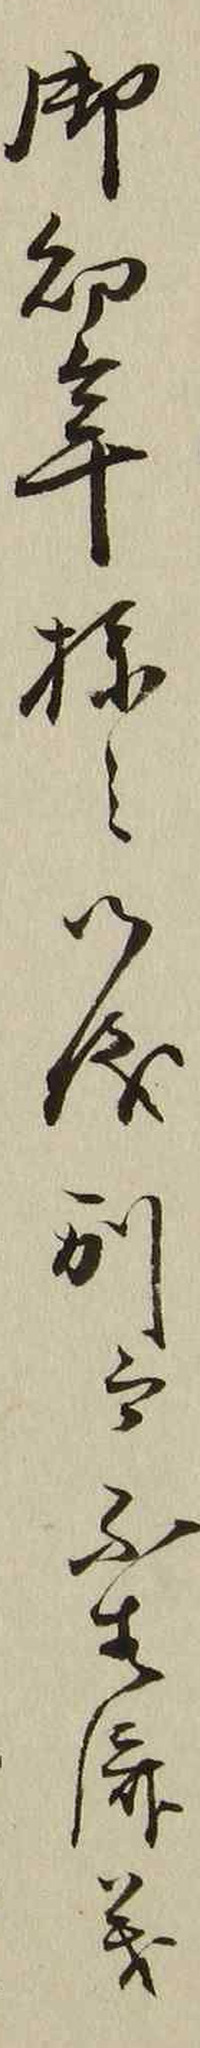御幼年様之御儀別而不相済候義
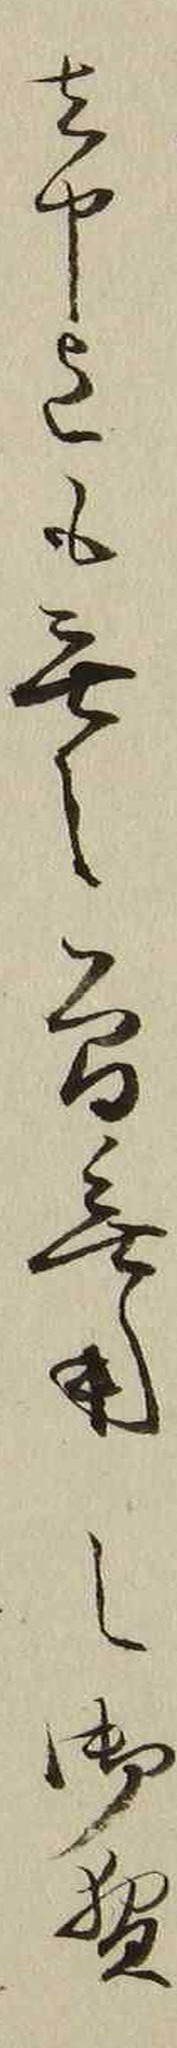は申迄も無之候間無用之御費
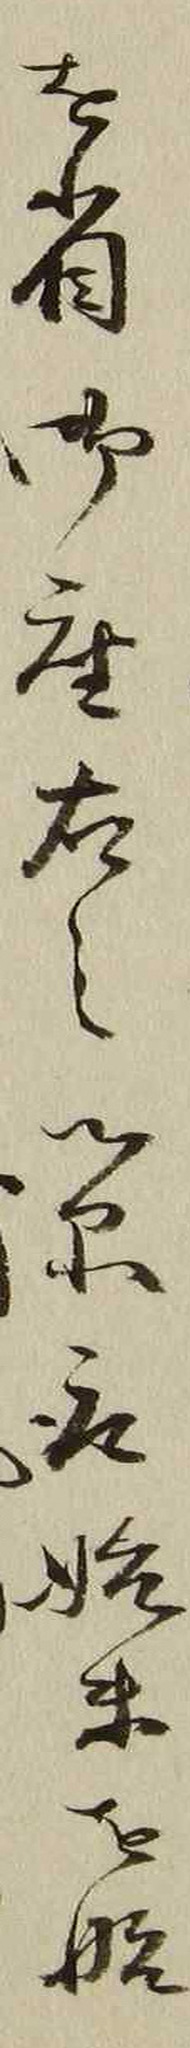を省御座右之御品取始末を始
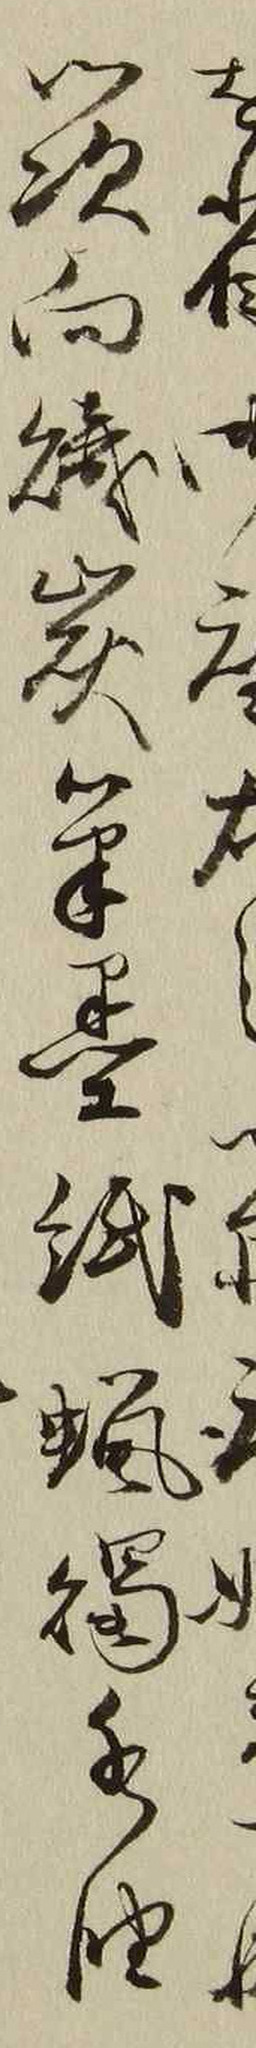御次向織炭筆墨紙蝋燭手油
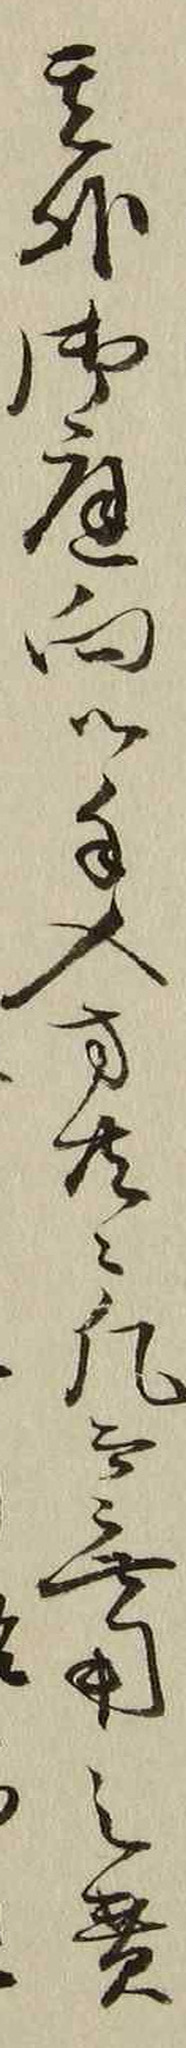其外御庭向御手入方共に凡而無用之費
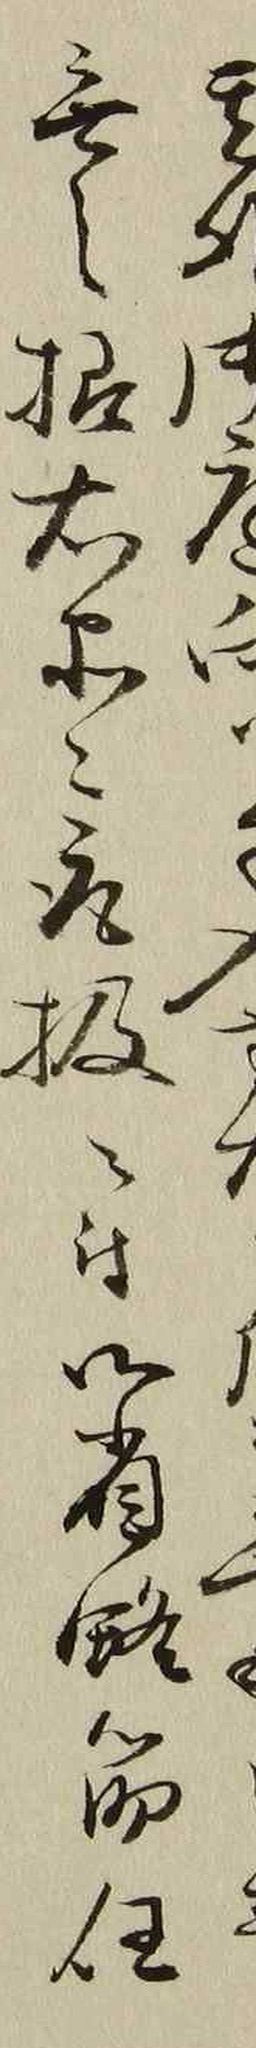無之様右品々取扱に付御省略筋任
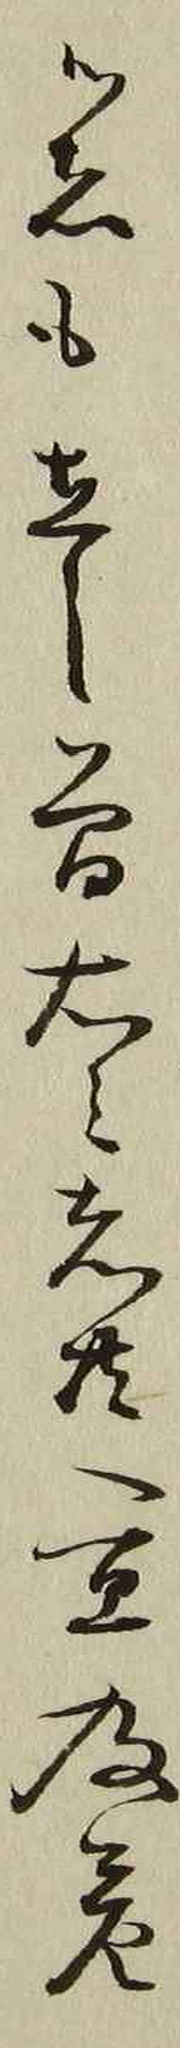候者も在之候間右之者共へ宜及指
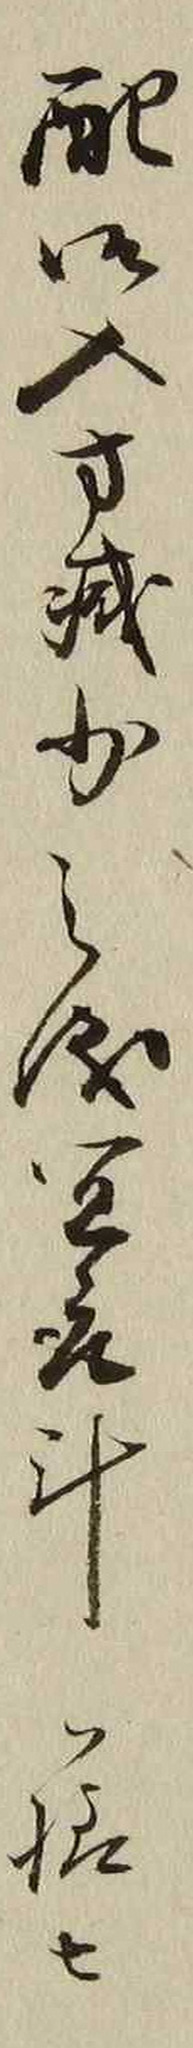配御入方減少之義宜取候様被
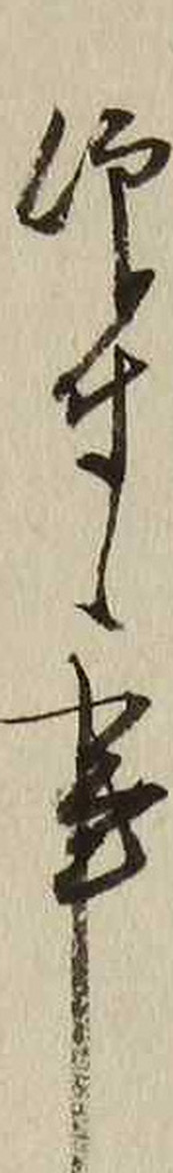仰付候事
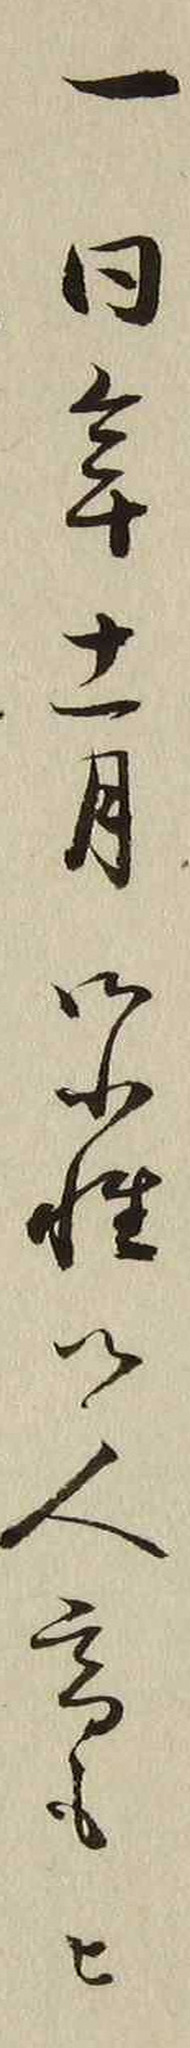一同年十一月御小姓御人高も被
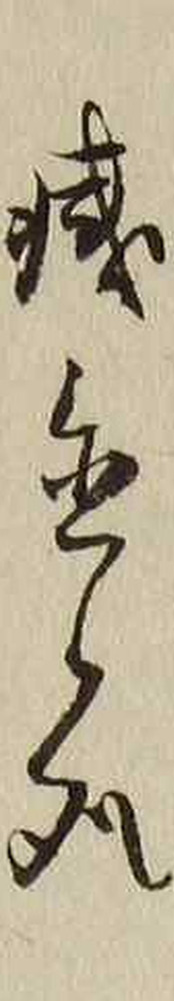減置候処
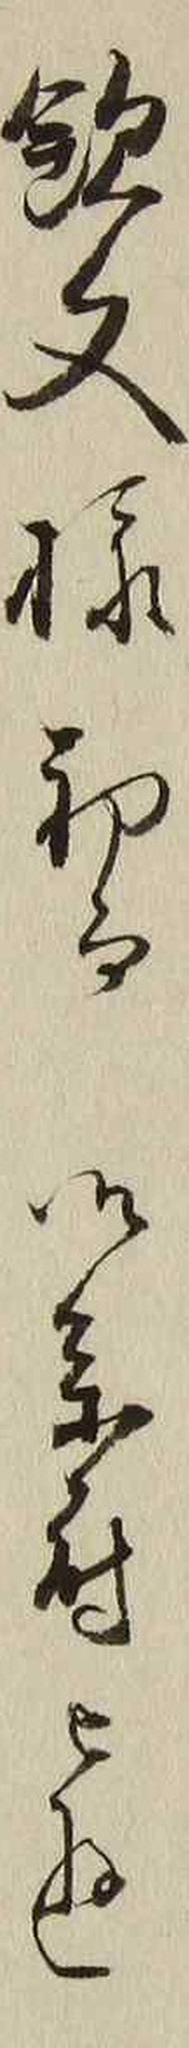欽文様初而御参府被遊
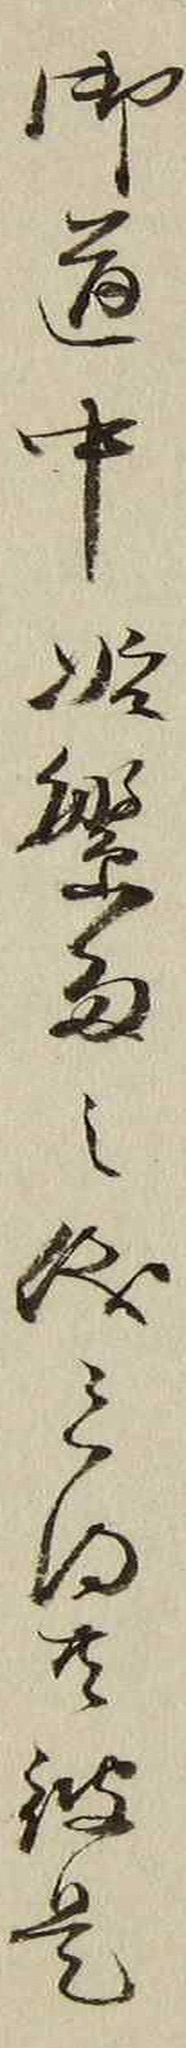御道中順繁多之儀に候得共彼是
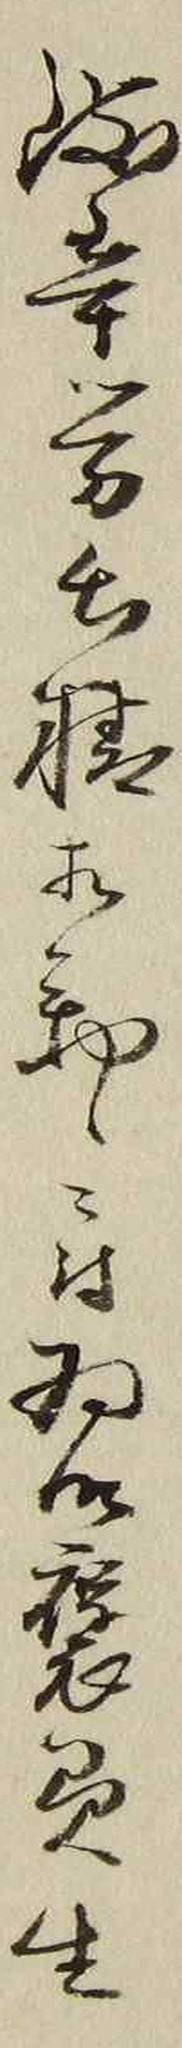致辛労出精相勤候に付為御褒美生
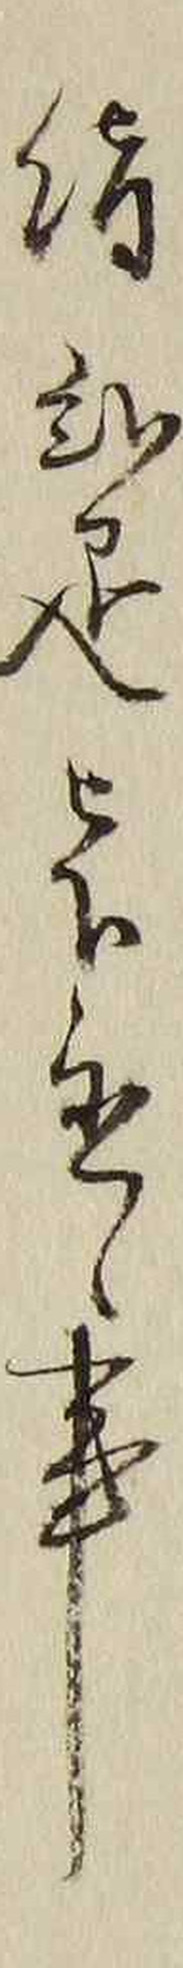絹弐疋被下置候事
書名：諸士系譜　巻之292　き之部1
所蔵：会津若松市立会津図書館
